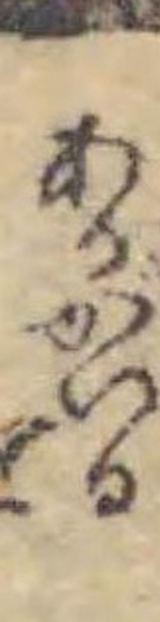あかがいる
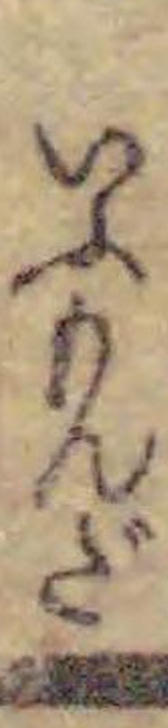いふもんだ
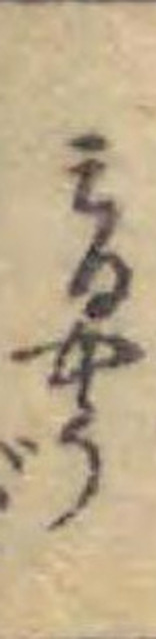みるやう
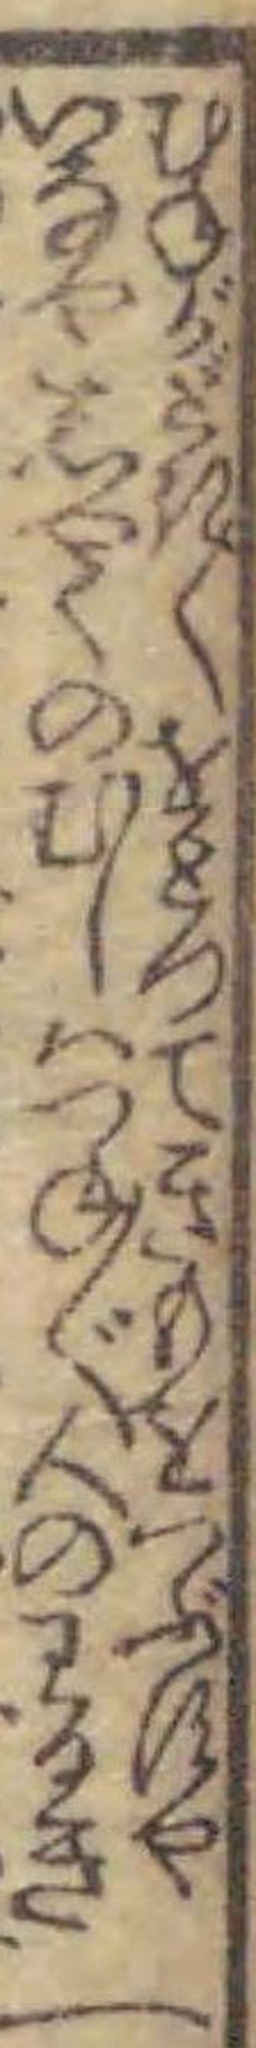いなやしやくのむしはつね〴〵人のわるき
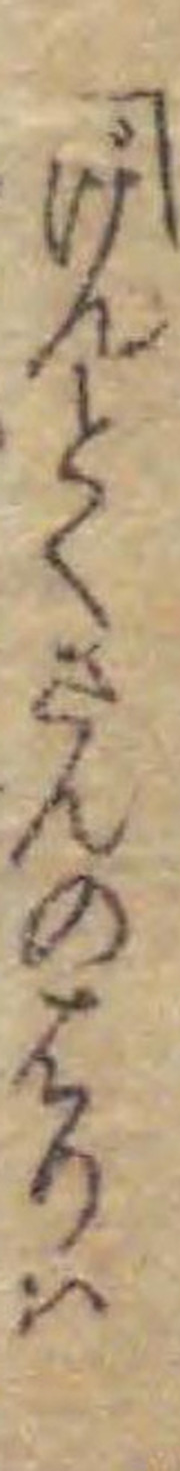〽げんとくさんのはりは
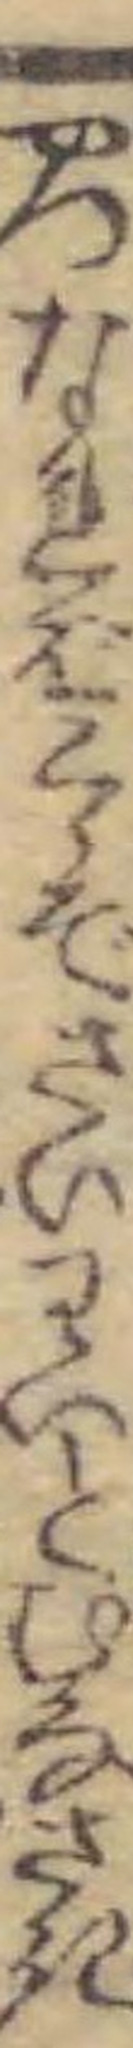やつなればこゝぞさいわいとむなさき
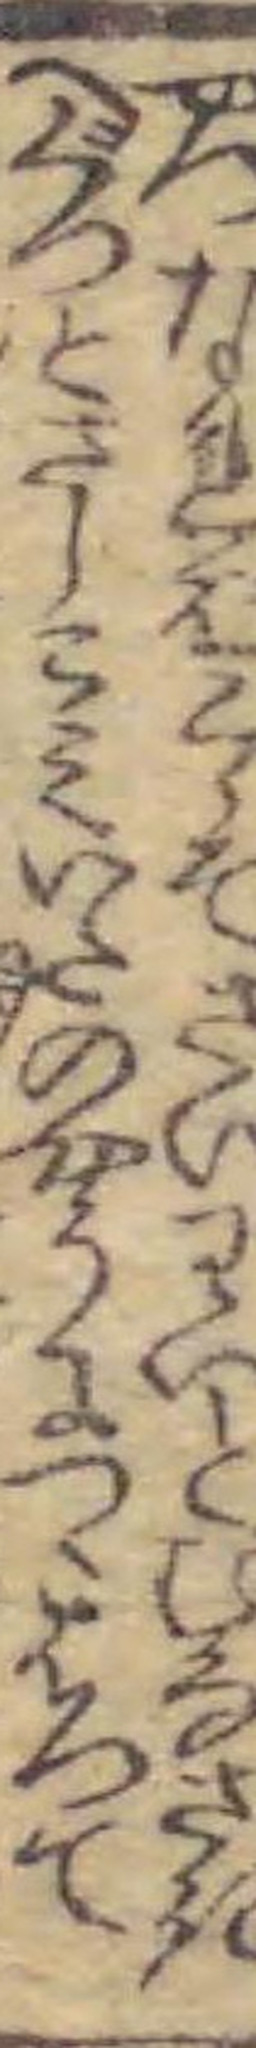へぐつとさしこみいたのやうにつゝはつて
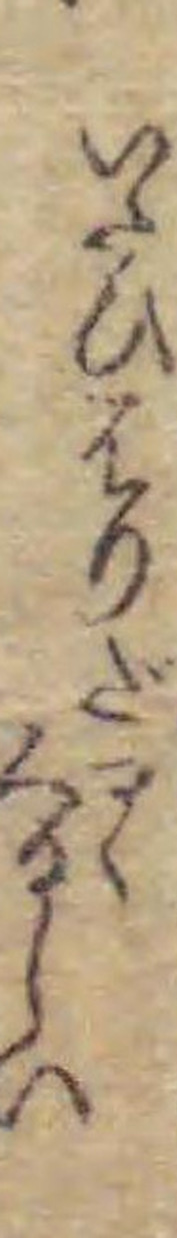いたひはりだヽ
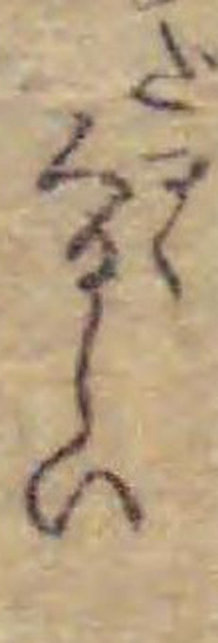くるしい
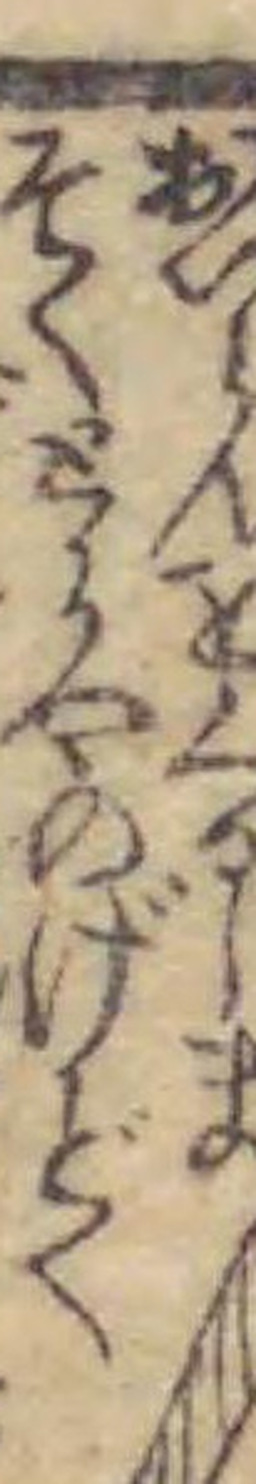そくとらやのげどく
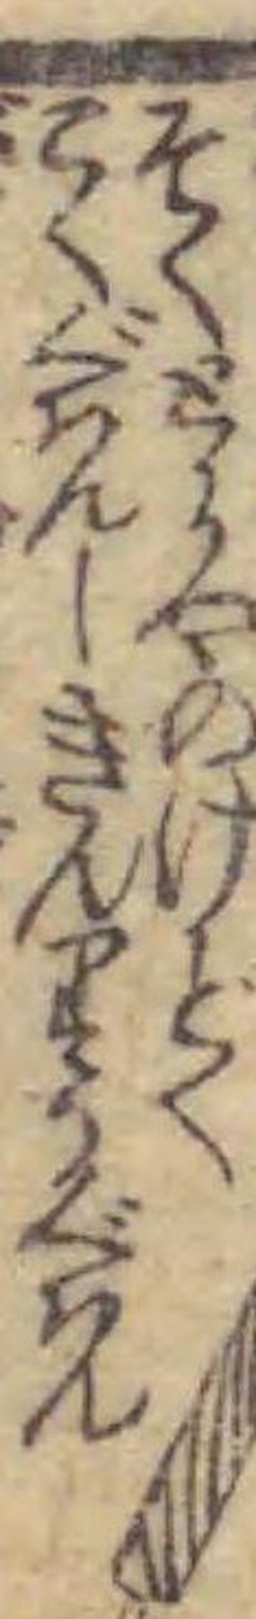こくぐはんしきんりうぐはん
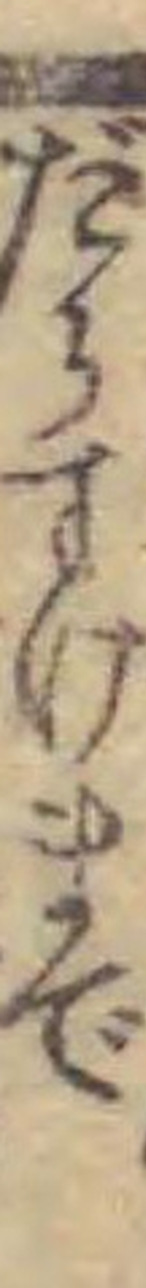だらすけまで
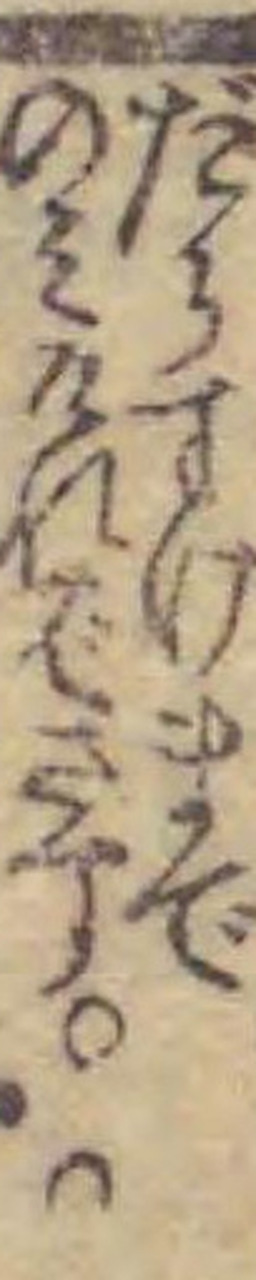のみければさす
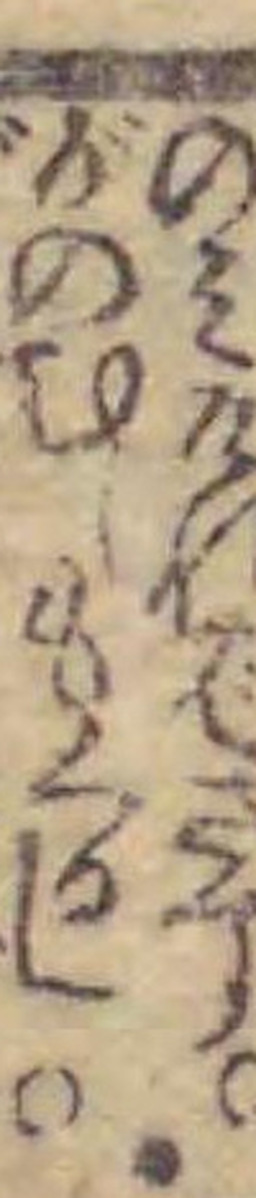がのむしもくるし
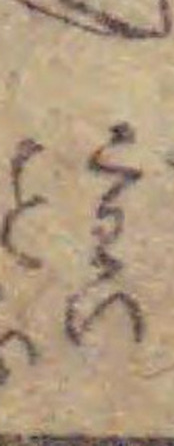こわい
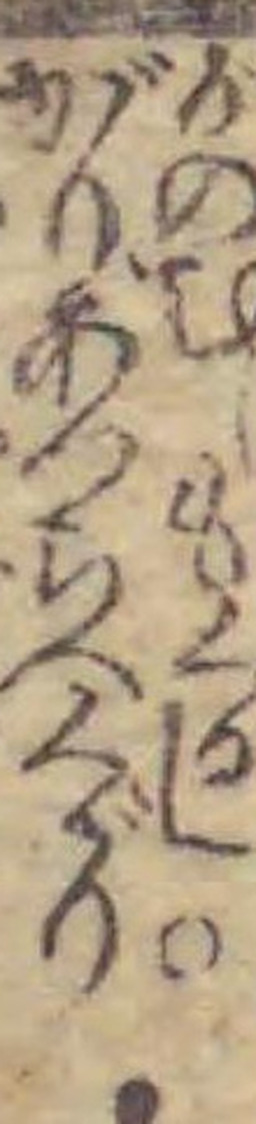がりあつちへくゞり
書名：十四傾城腹之内 : 3巻
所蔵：国立国会図書館 National Diet Library, JAPAN
